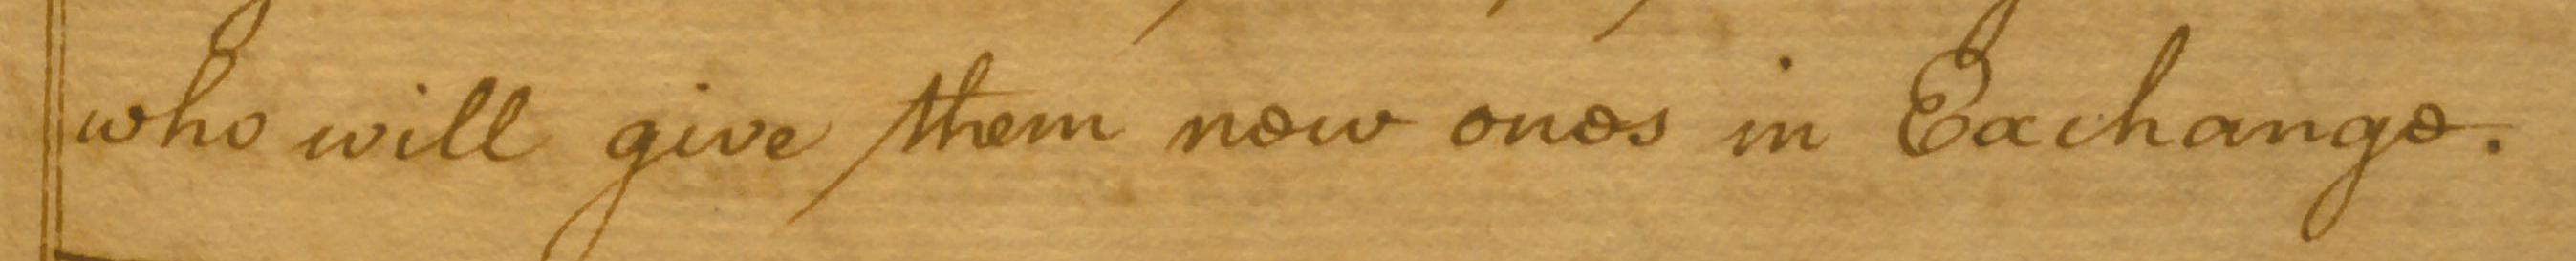who will give them new ones in Exchange.
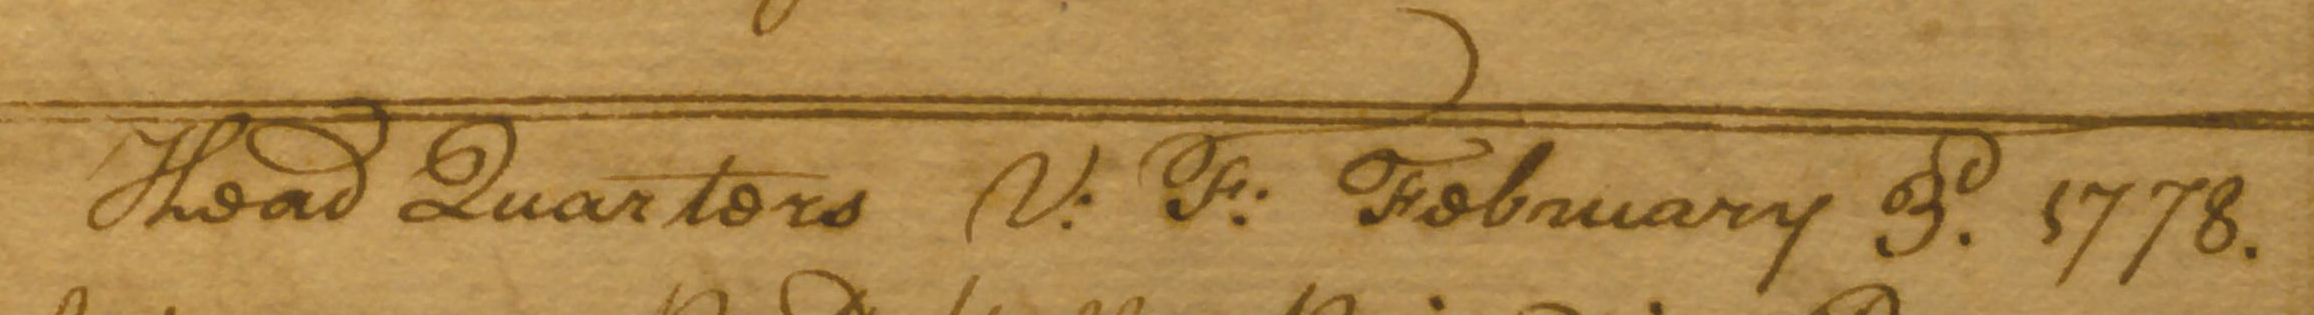Head Quarters V: F: February 3^d. 1778.
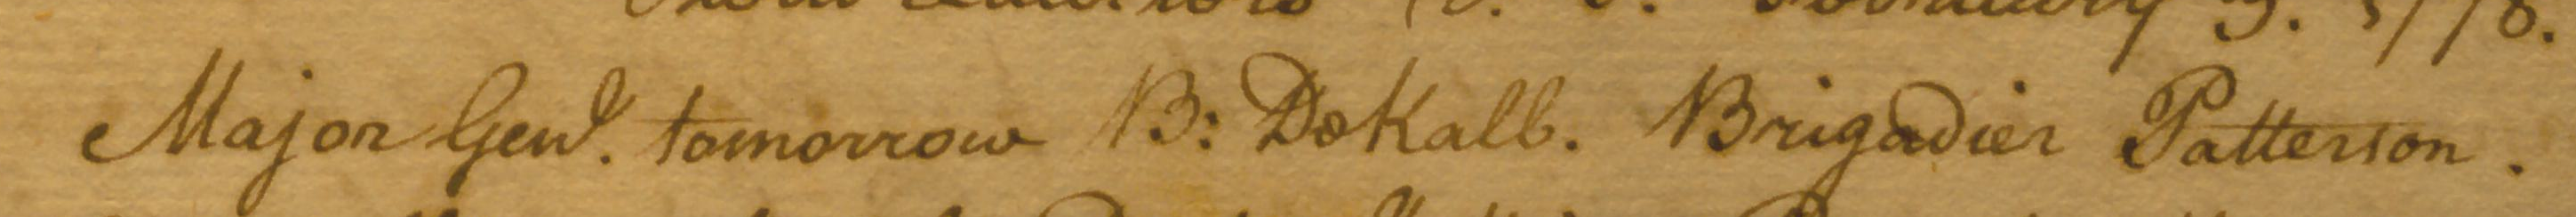Major Gen^l. tomorrow B: DeKalb. Brigadier Patterson.
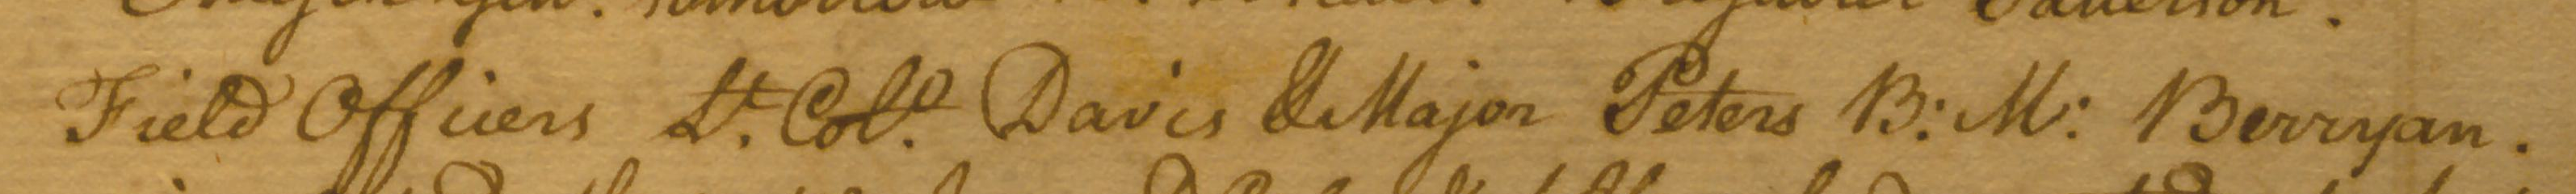Field Officers L^t. Col^o. Davis & Major Peters B: M: Berryan
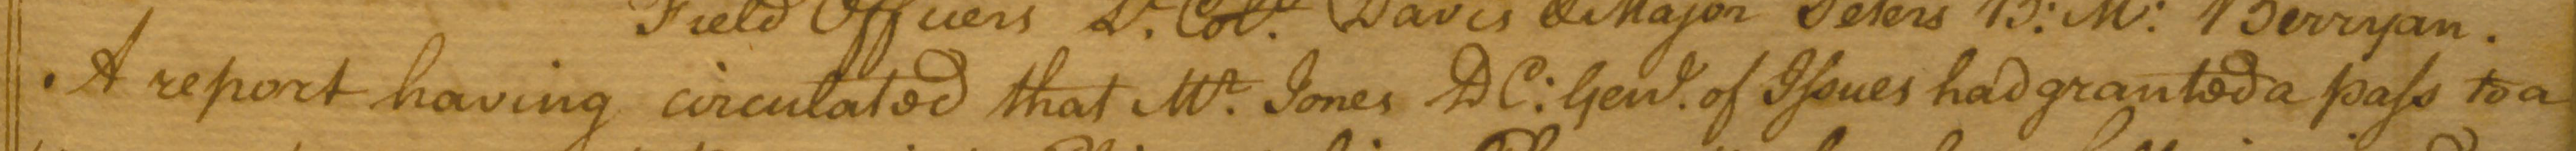A report having circulated that M^r. Jones DC: Gen^l. of Issues had granted a pass to a
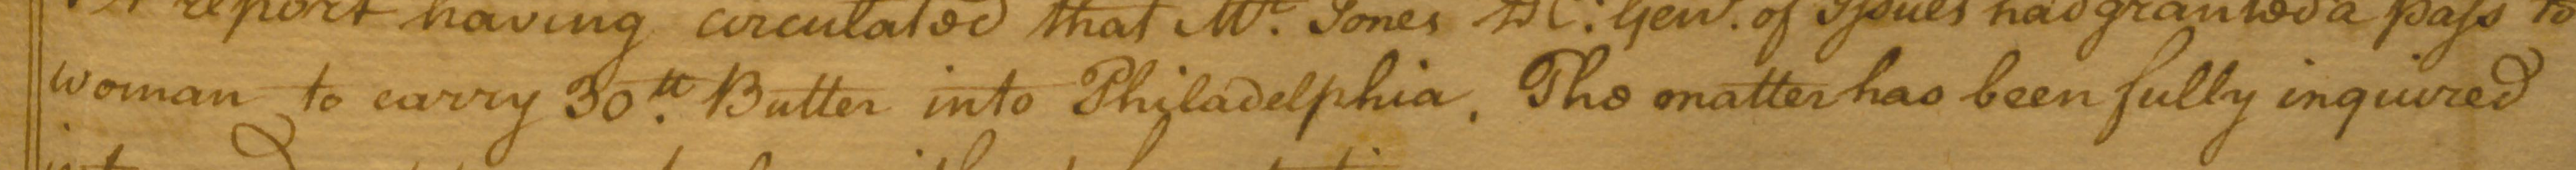woman to carry 30 ^lb. Butter into Philadelphia. The matter has been fully inquired
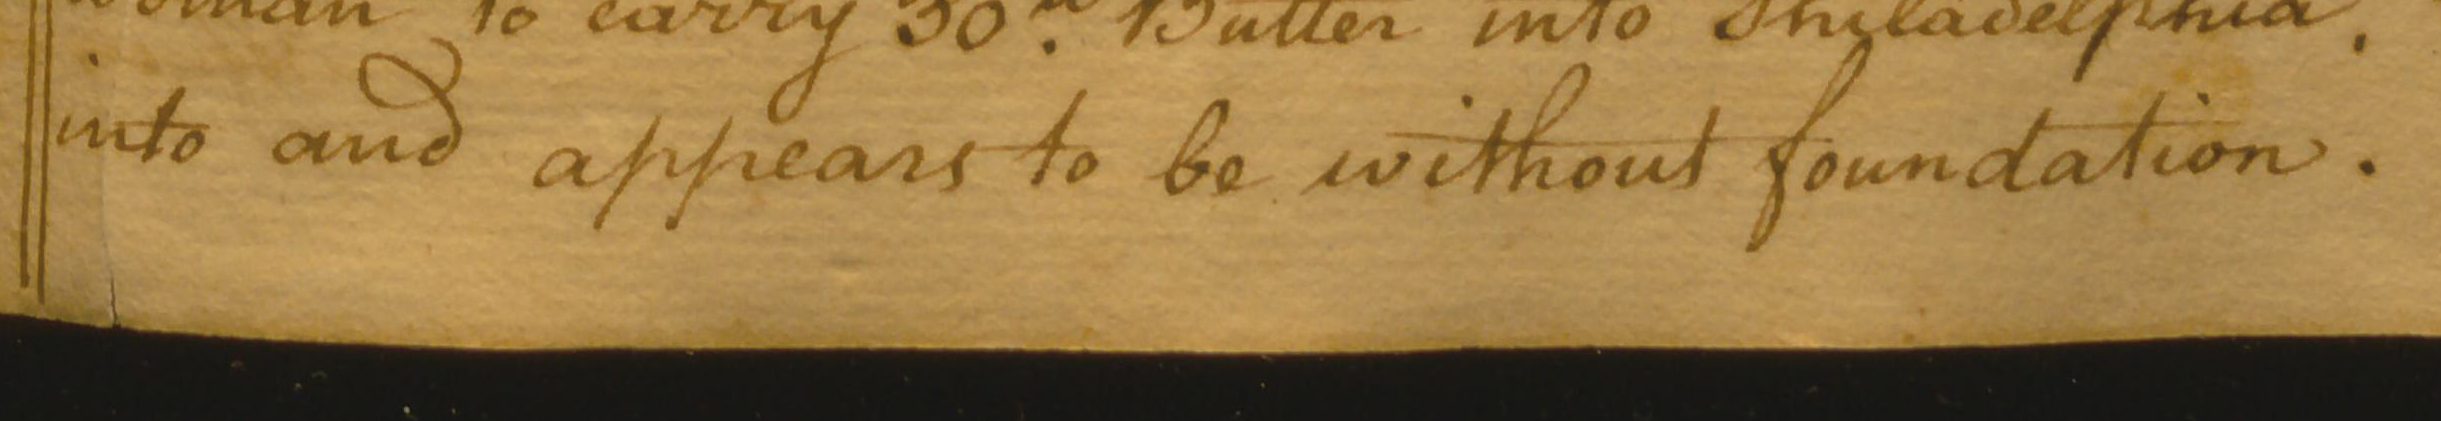into and appears to be without foundation.
